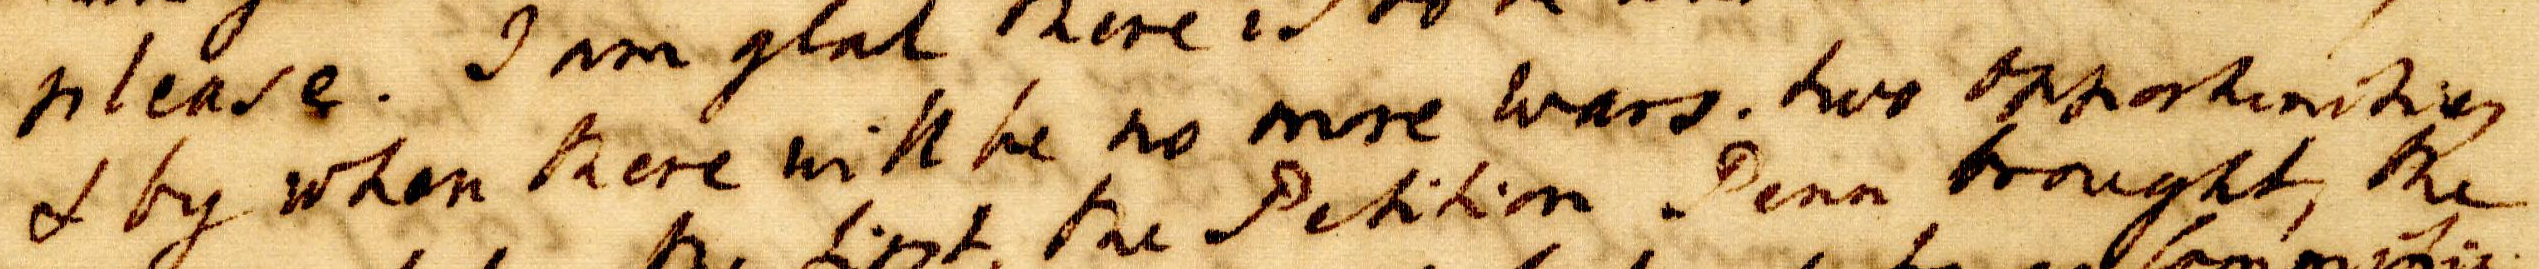& by when there with he no more wars. Two opportunities
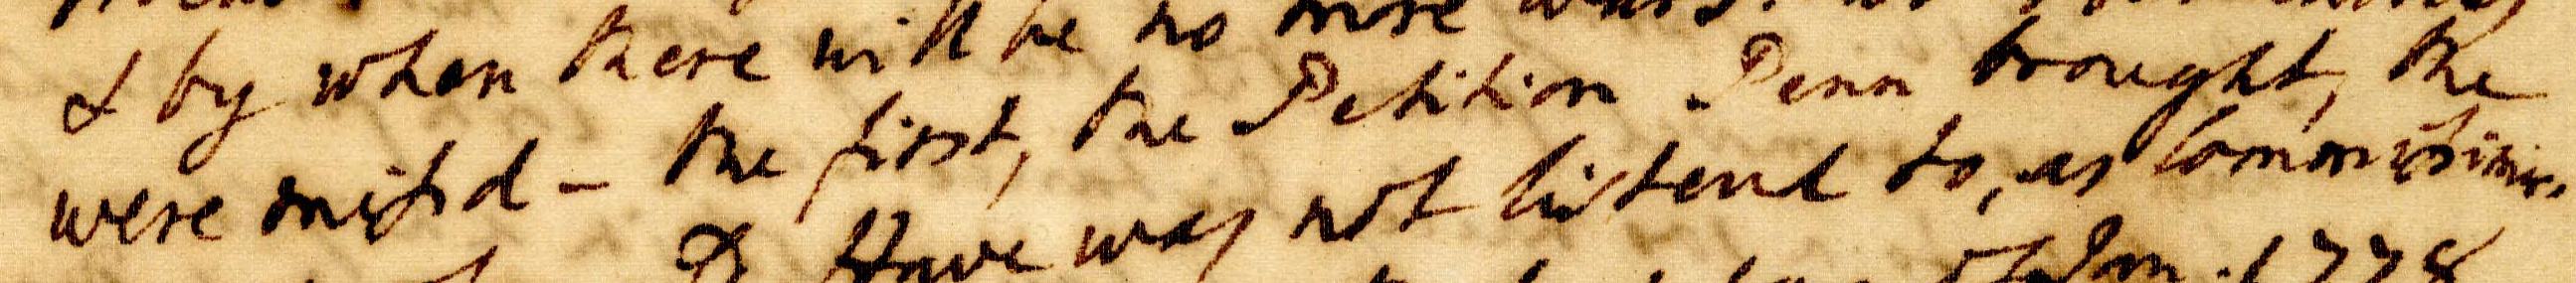were misd- the first, the Petition Penn thought, the
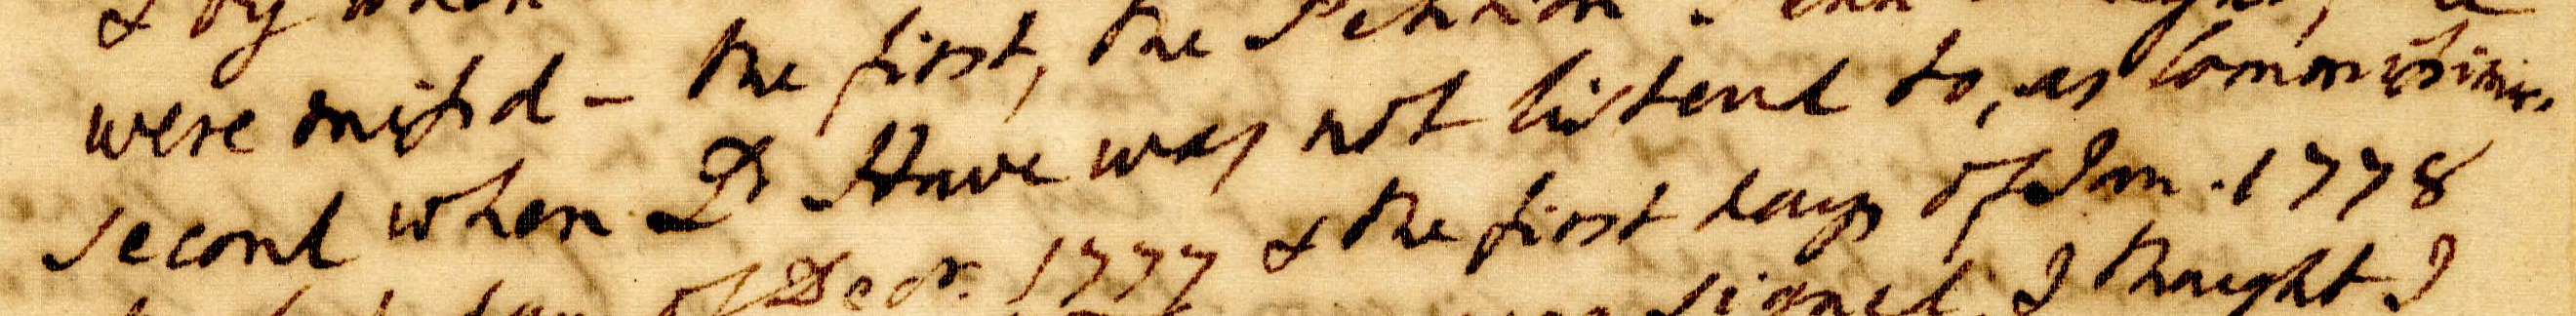second when D Howe was not listened to, as Communicated
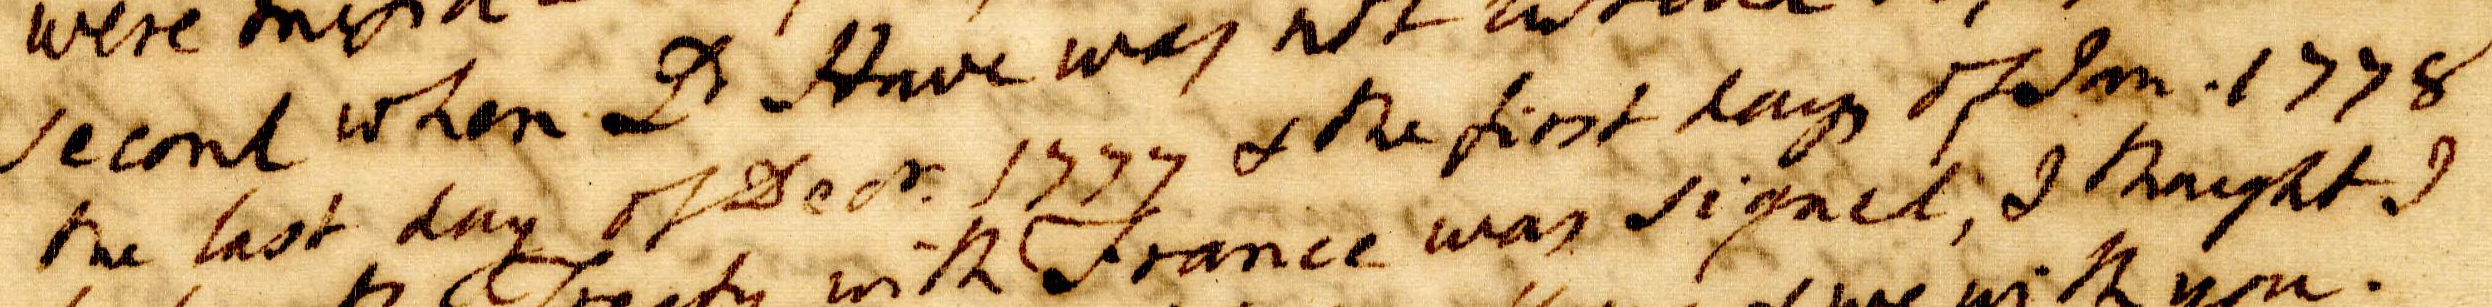the last day of Dec^r. 1777 & the first days of Jan. 1778
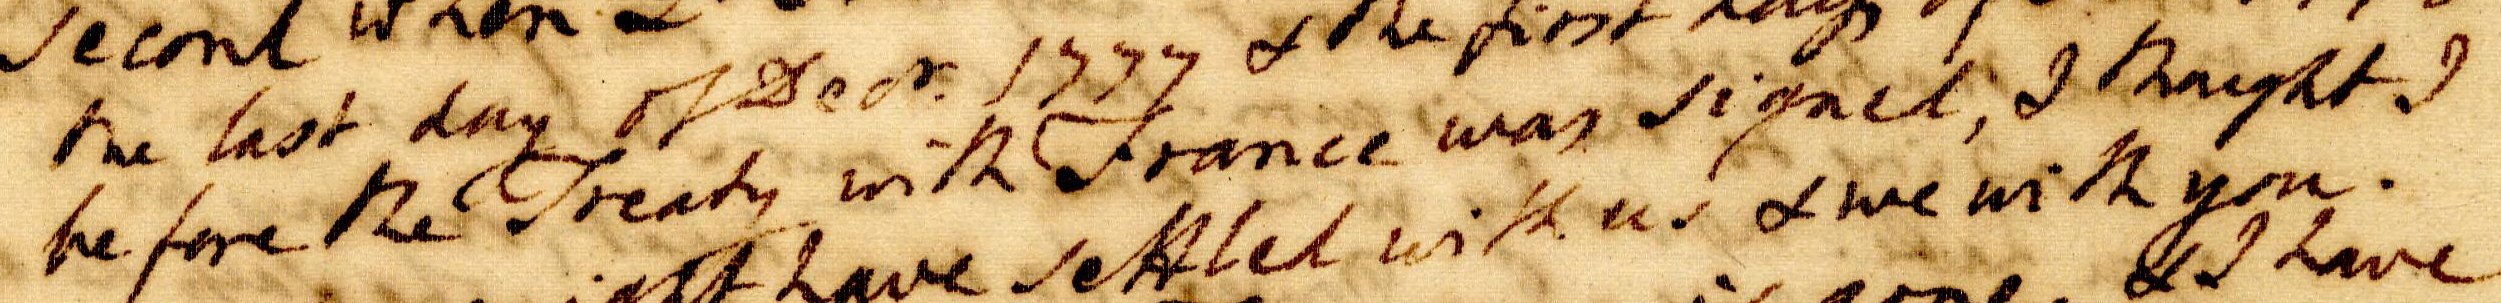before the Treaty with France was signed, I thought I
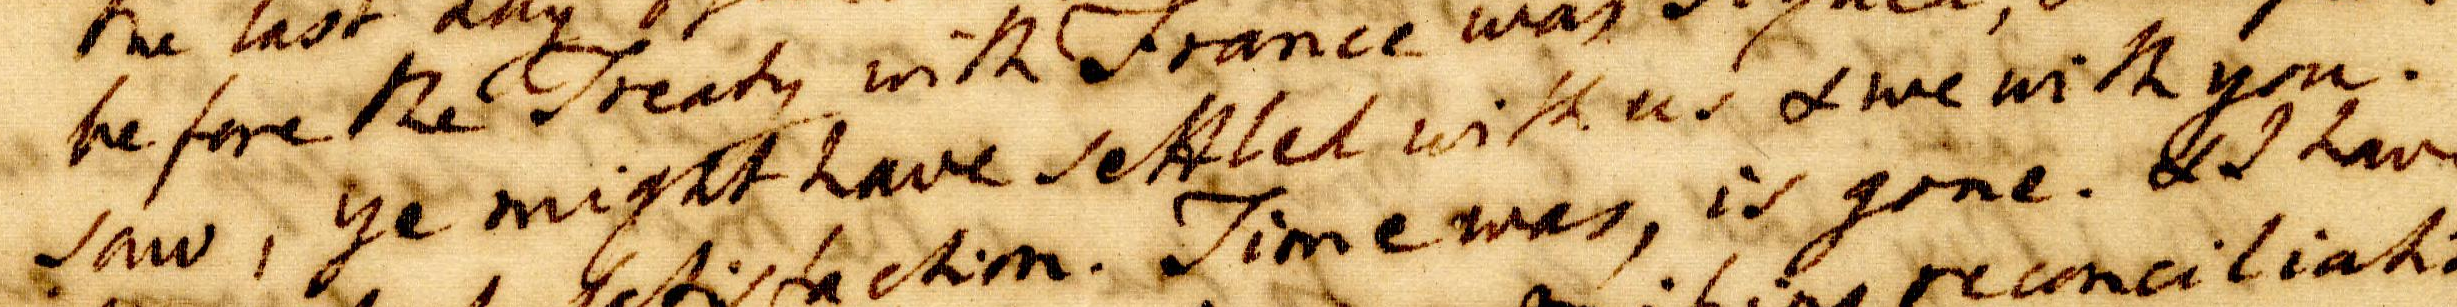saw, ye might have settled with us & we with you.
